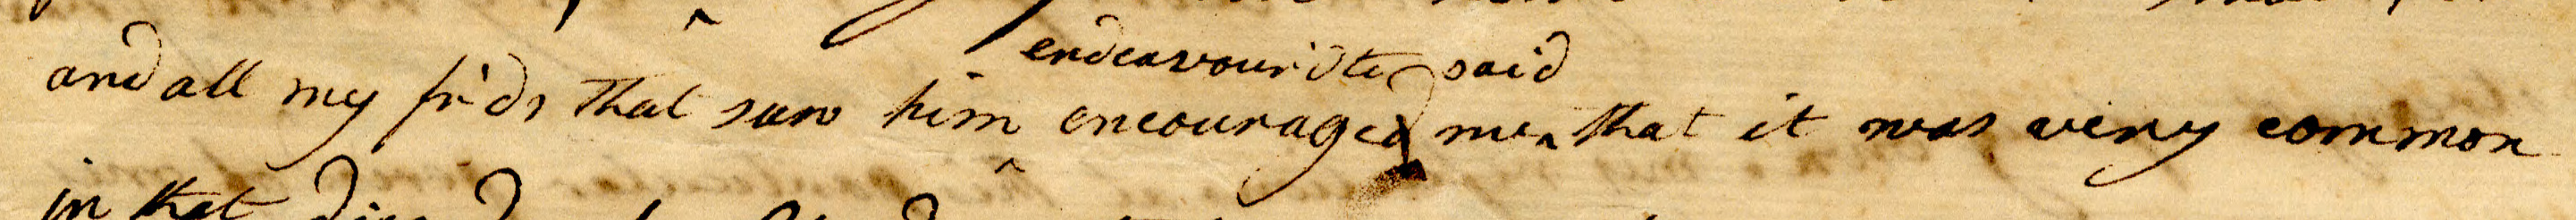and all my frids that saw him encouraged me that it was very common
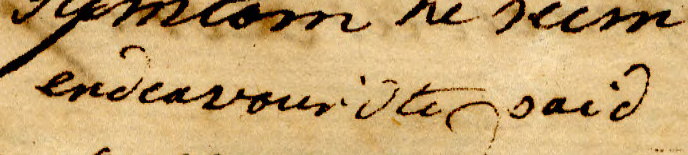endeavour'd to said
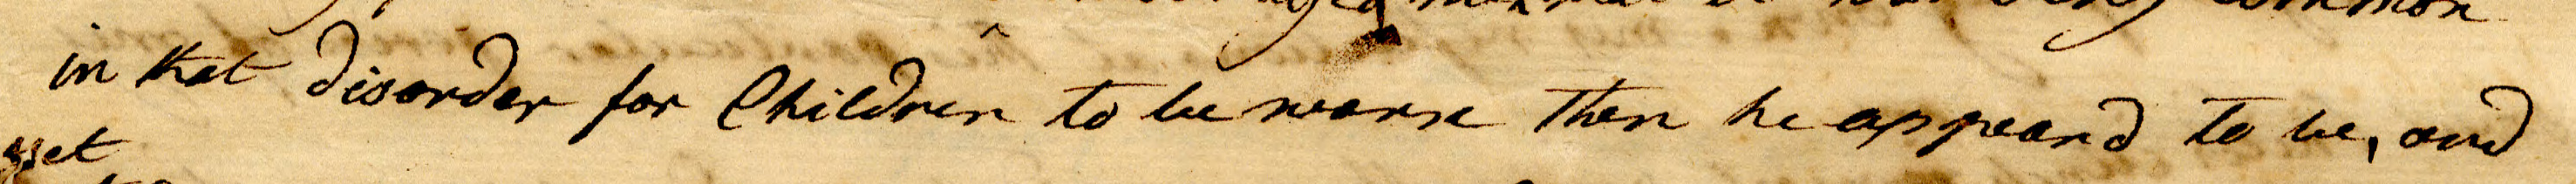in that disorder for Children to be worse then he appeared to be, and
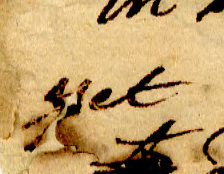yet
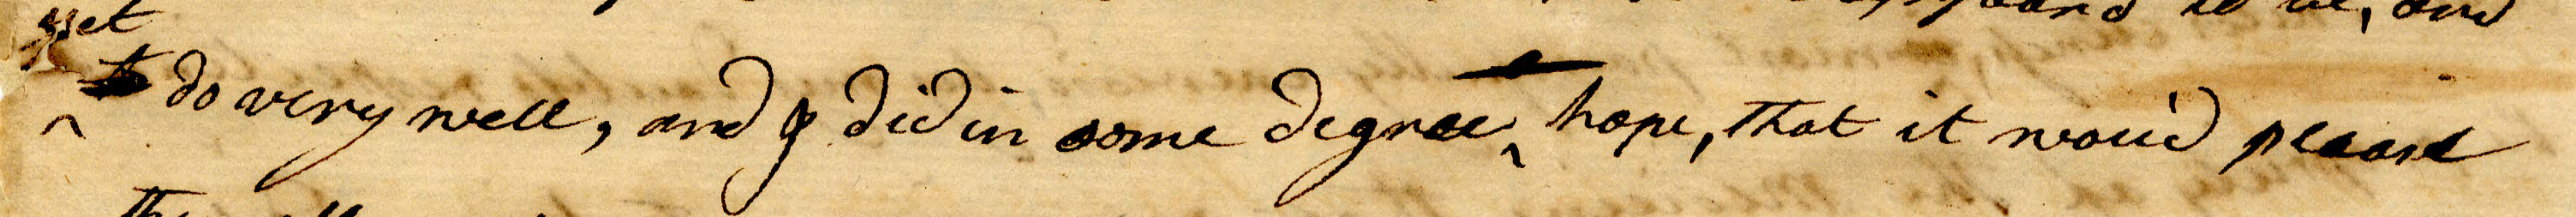^ [to] do very well, and I did in some degree hope, that it wou'd please
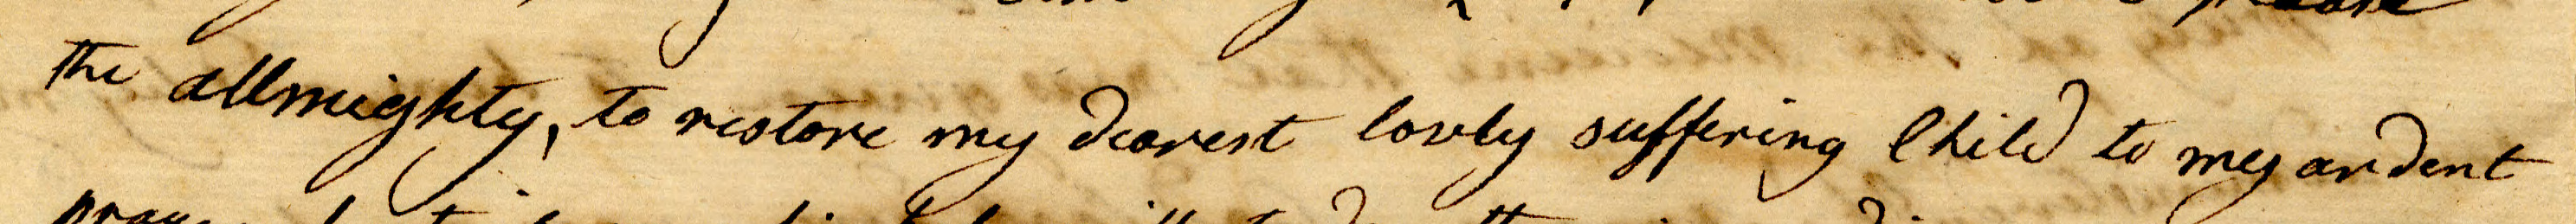the allmighty, to restore my dearest lovly suffering Child to my ardent
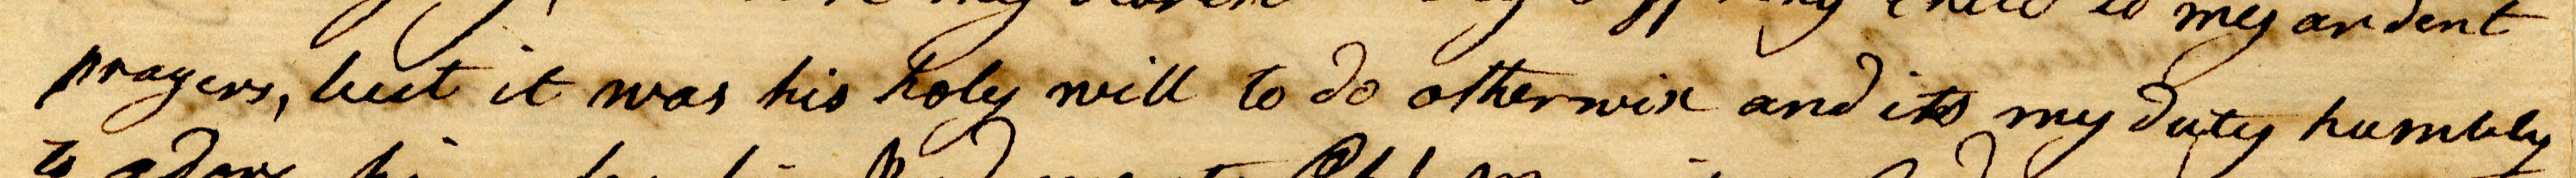prayers, but it was his holy will to do otherwise and its my duty humbly
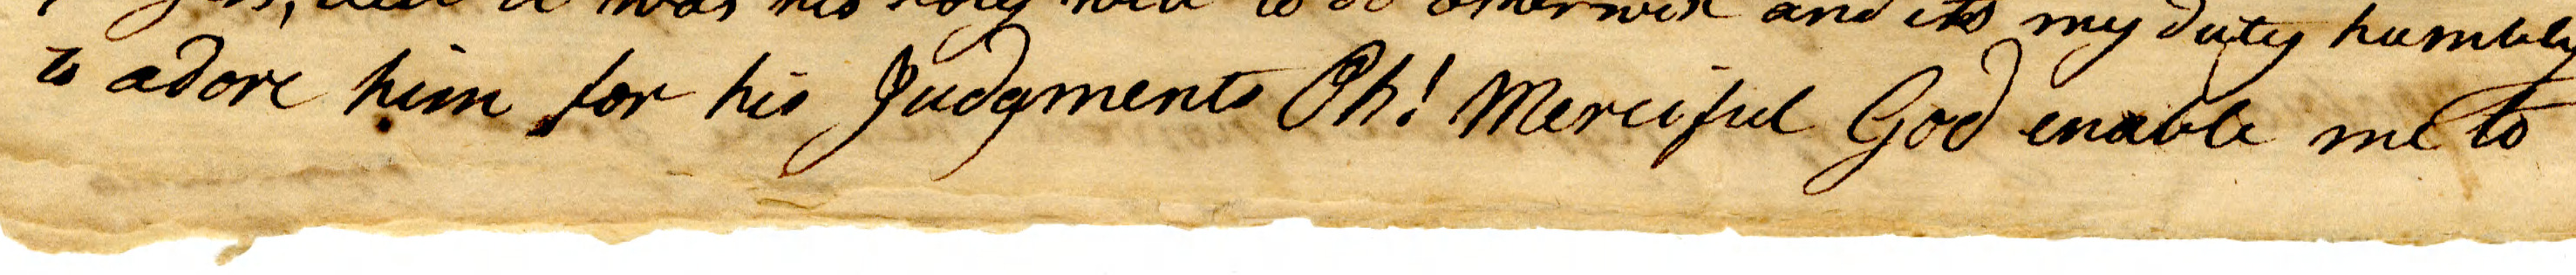to adore him for his Judgments Oh! Merciful God enable me to
